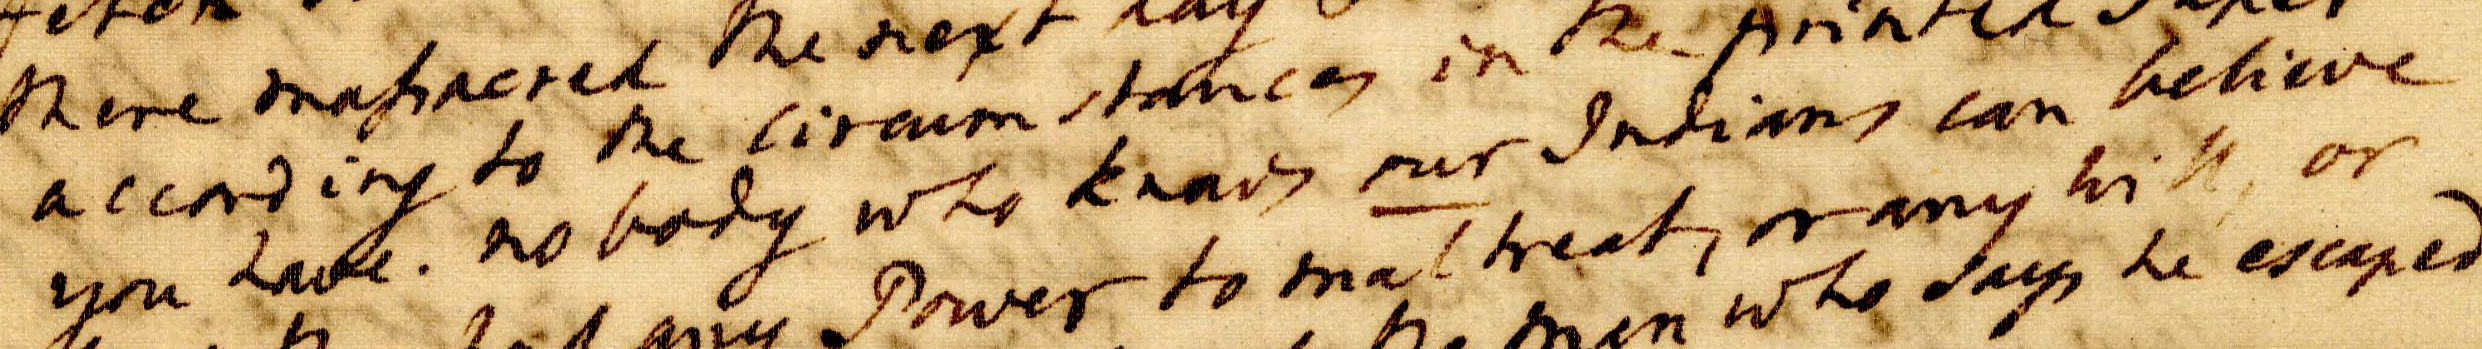you have. no body who knows our Indians can believe
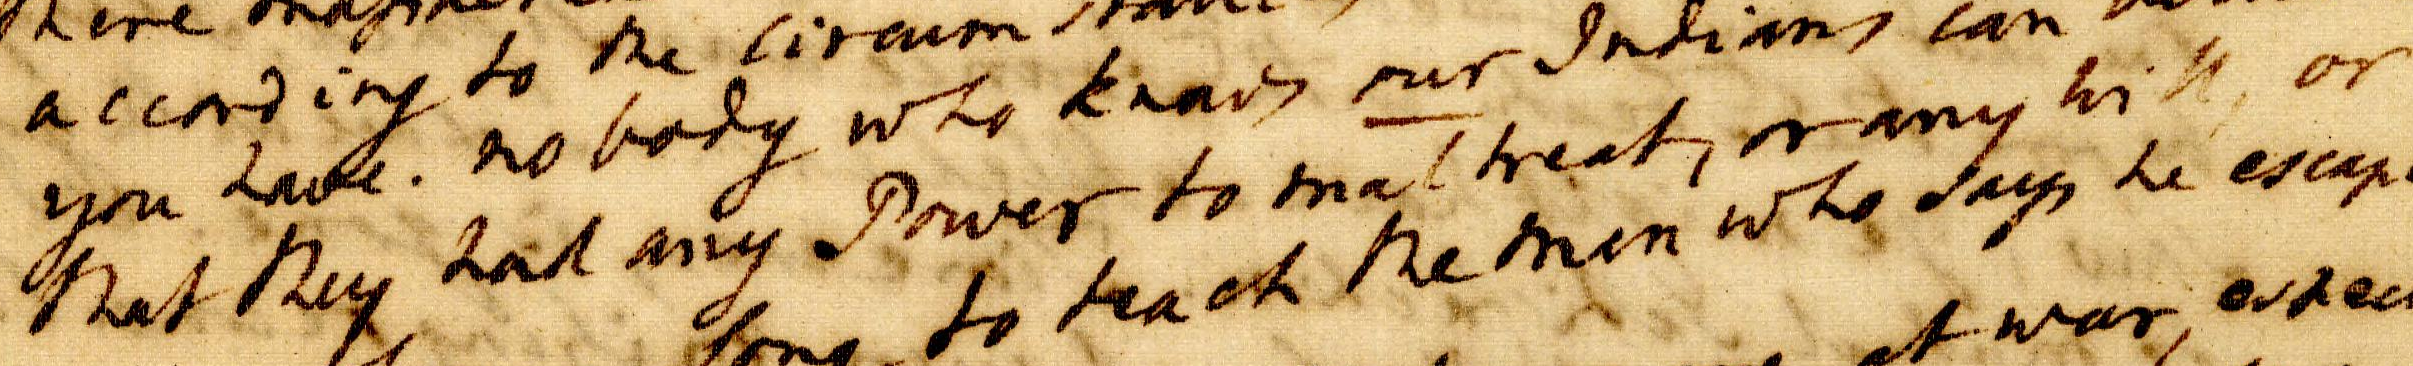that they had any Power to maltreat, or any kill, or
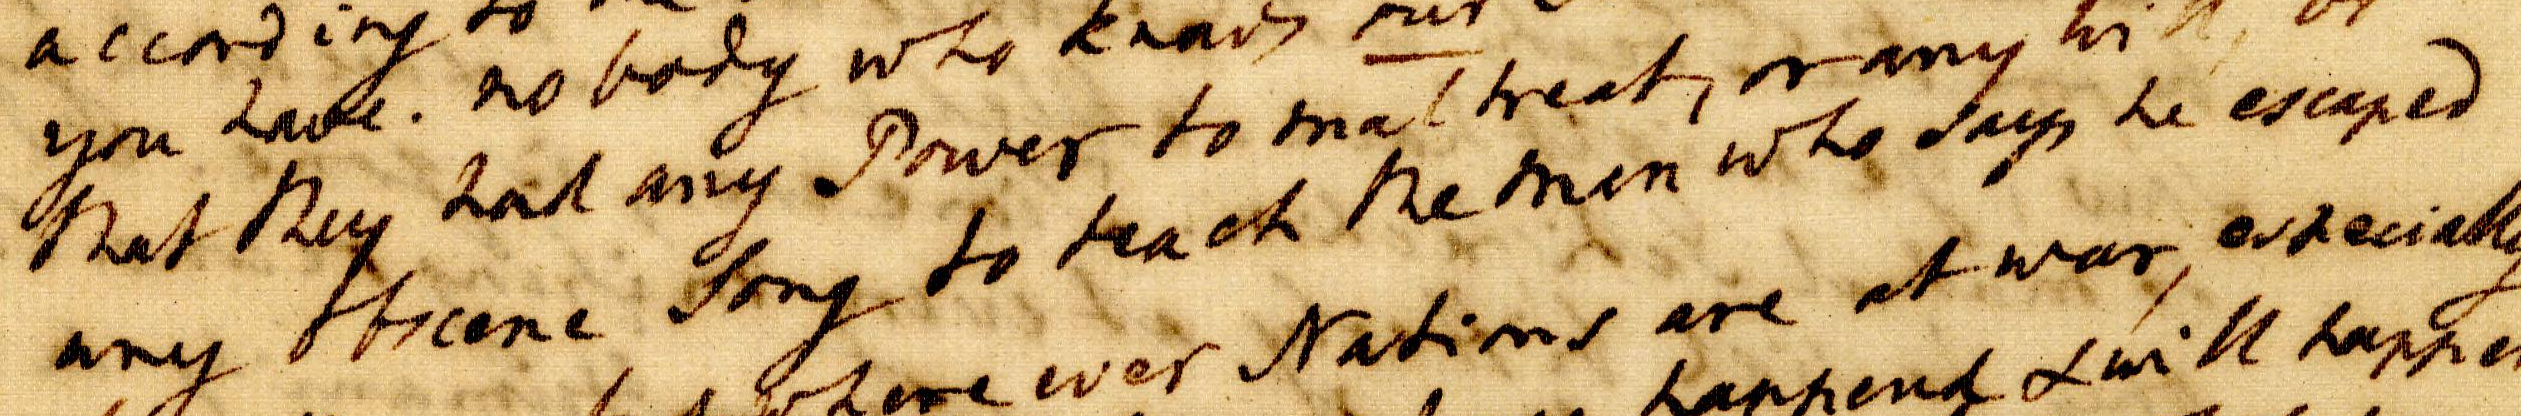any Obscene Song to teach the man who says he escaped
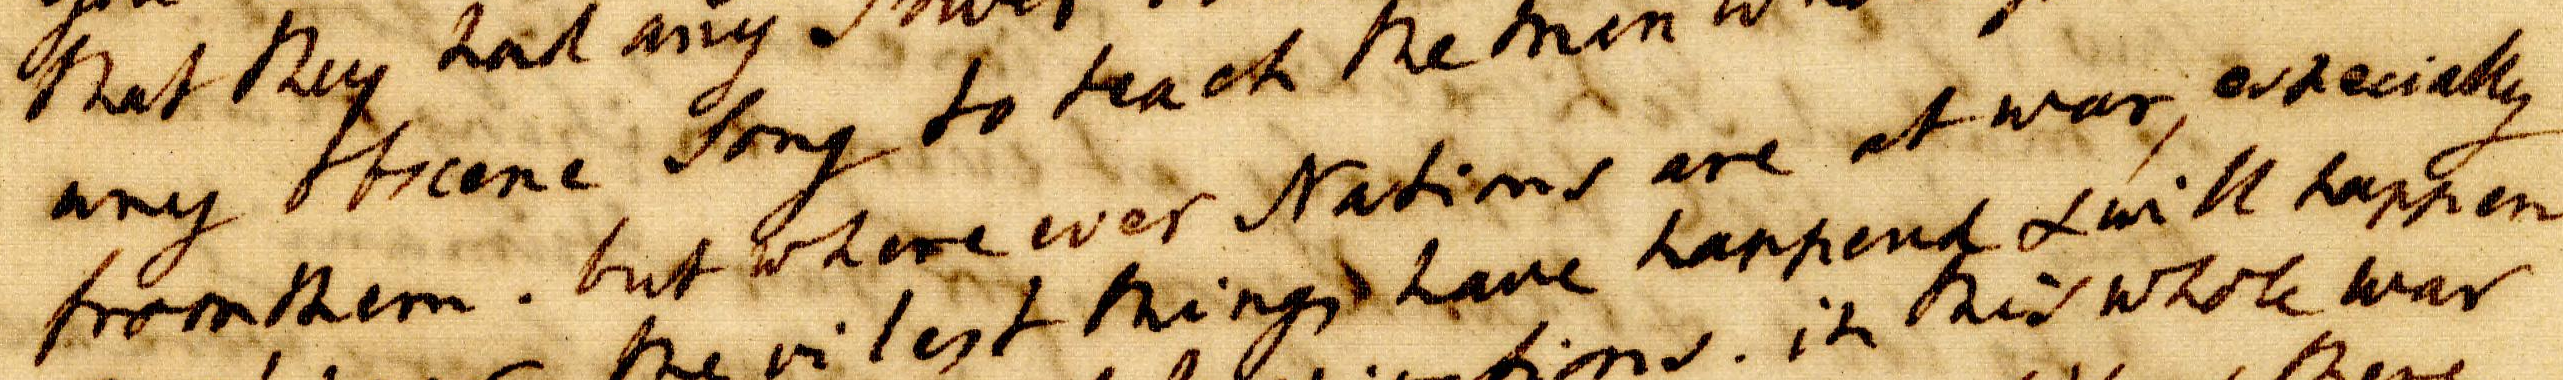from them. but where ever Nations are at war, especially
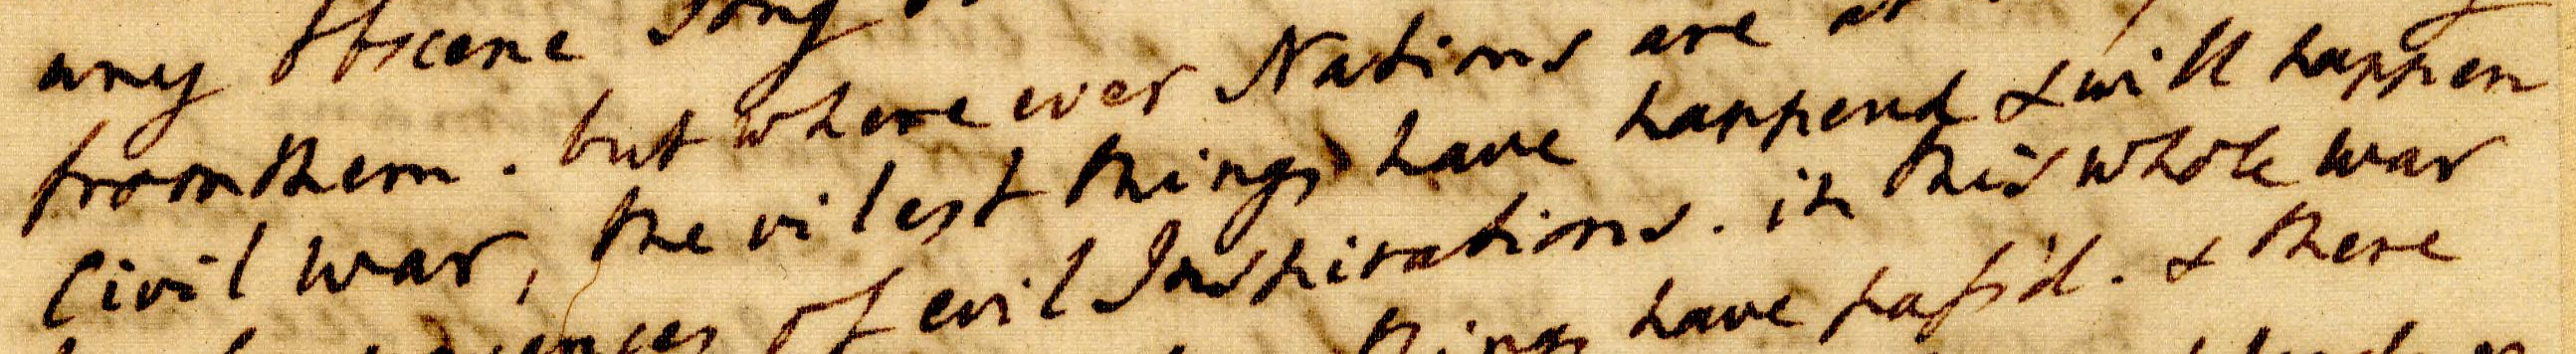Civil War, the vilest things have happened & will happen
